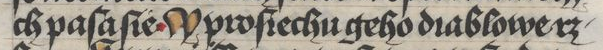ch paſa ſie.Yproſiechu geho diablowe rz¬
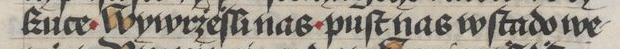kuce.Wywrżeẛli nas.puſt nas w ſtado we¬
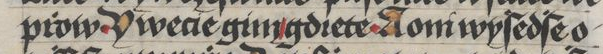pṙow.Y wecie gim.gdiete.A oni wyẛedẛe o¬
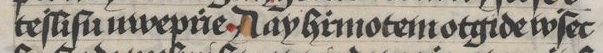teẛli ſu uwepṙie.A ay hṙmotem otgide wẛec¬
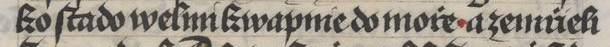ko ſtado welmi kwapnie do moṙe.a zemṙieli
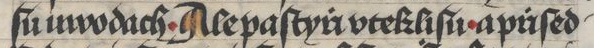ſu uwodach.Ale paſtyṙi vtekli ſu.a pṙiſed¬
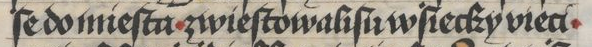ẛe do míeſta.zwíeſtowali ſu wẛiecky vieci.
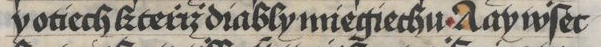y otiech kteṙiż diably míegíechu.A wẛec¬
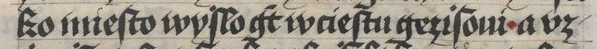ko mieſto wyẛlo ḡt wcieſtu geziẛoui.a vz¬
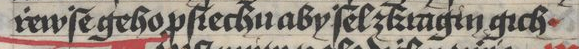ṙewẛe geho pſiechu aby ẛel zkragin gich.
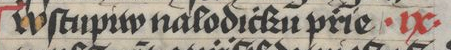Wſtupiw nalodiċku pṙie.ix.
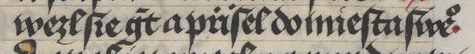wezl ſie ḡt a pṙiẛel do mieſta ſweo.
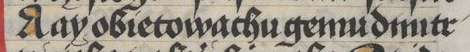A ay obietowachu gemu dnu tr¬
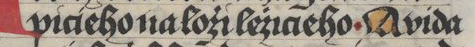picíeho na lożi leżicieho.A vida
